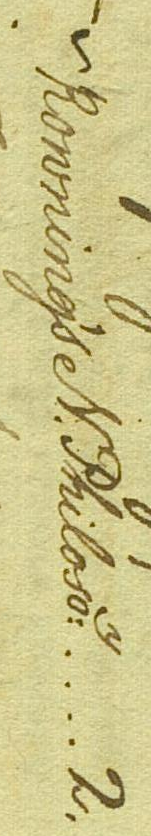- Rowning's N. Philoso^y: .... 2.
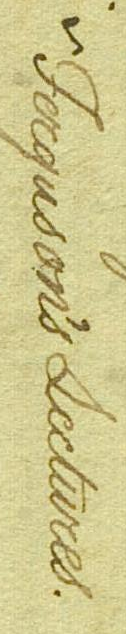- Ferguson's Lectures.
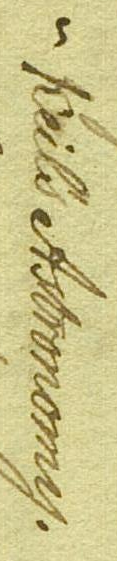- Keil's Astronomy.
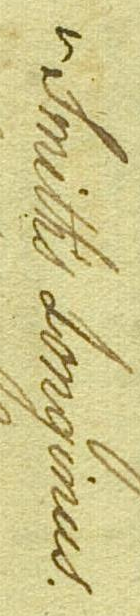- Smith's Longinus.
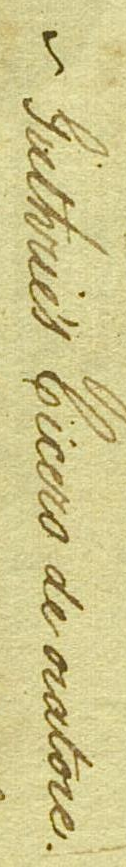- Guthrie's Cicero de oratore.
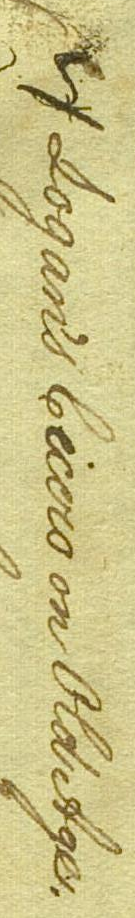- Logan's Cicero on Old Age.
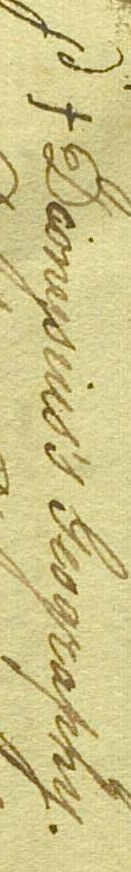jd + Dionysius's Geography.
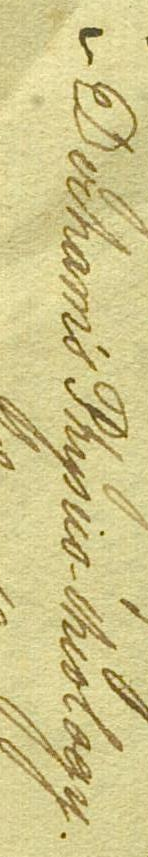- Derham's Physico-theology.
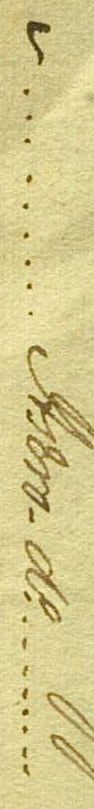- ......... Atro. d^o.......
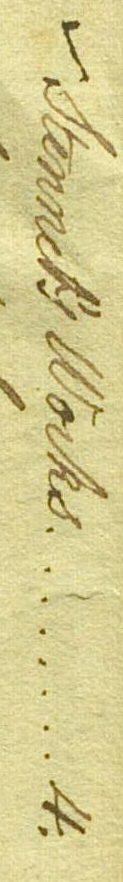- Stennet's Works........4.
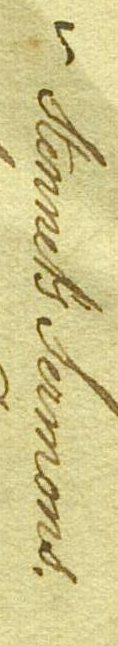- Stennets Sermons.
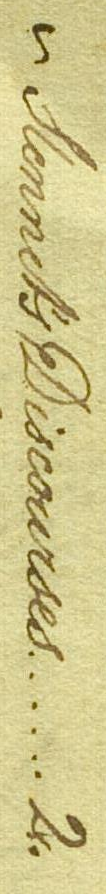- Stennet's Discourses...... 2.
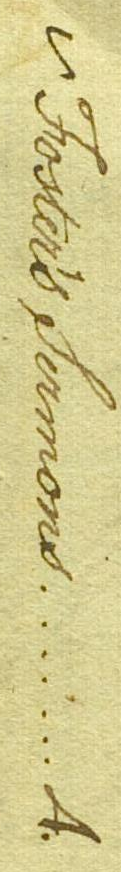- Foster's Sermons........4.
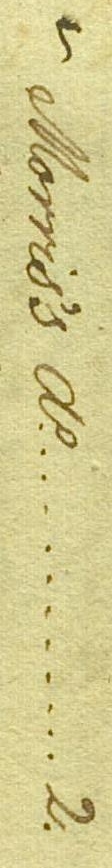- Morris's d^o...........2.
